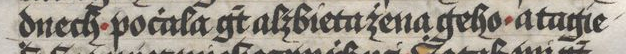dnech.poċala ḡt alzbieta żena geho.atagie¬
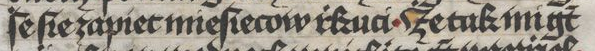ſe ſie zapiet mieſecow ṙkuci.Że tak mi ḡt
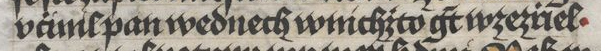vċinil pan wednech wnichżto ḡt wzezṙiel.
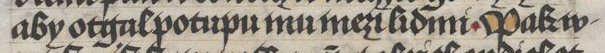aby otgal potupu mu mezi lidmi.Pak w¬
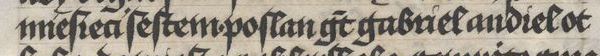míeſieci ſeſtem.poſlen ḡt gabriel andiel ot
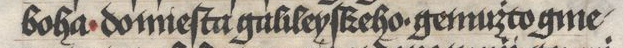boha.domieſta galileyſkého.gemużto gme¬
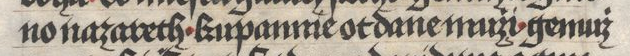no nazareth.kupannie otdane mużi.gemuż
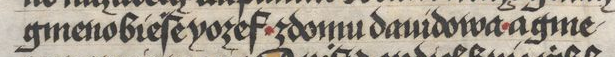gmeno bíeẛe yozef.zdomu dauidowa.a gme¬
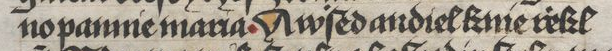no pannie maria.A wẛed andiel kníe ṙekl
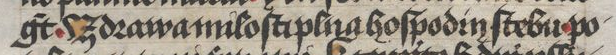ḡt.Zdrawa miloſti plna hoſpodin ſtebu.po¬
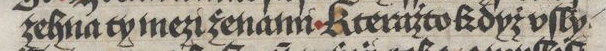zehna ty mezi żenami.Kterażto kdyż vſly¬
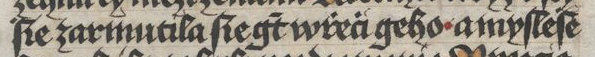ẛie zarmutila ſie ḡt wṙeċi geho.a myſleẛe
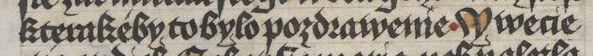kterakéby to bylo pozdrawenie.Y wecie
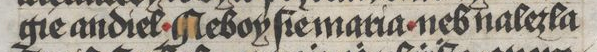gíe andiel.Neboy ſie maria.neb nalezla
